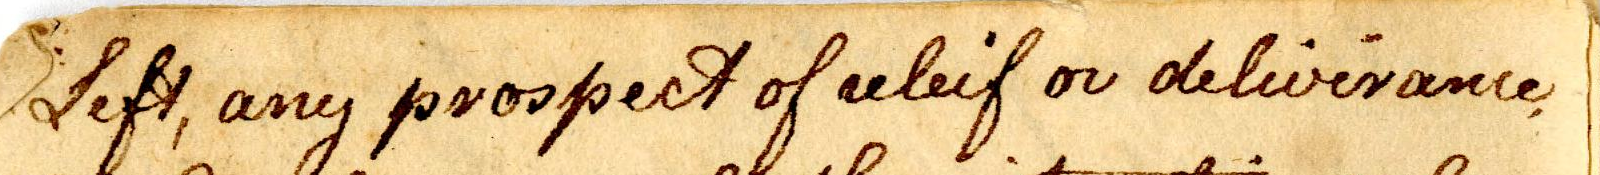Left any prospect of releif or deliverance
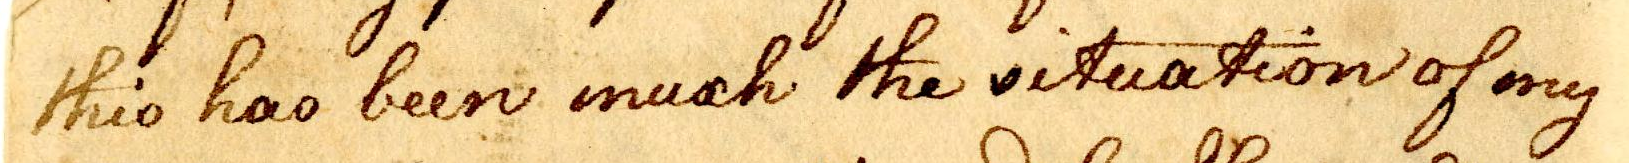this has been much the situation of my
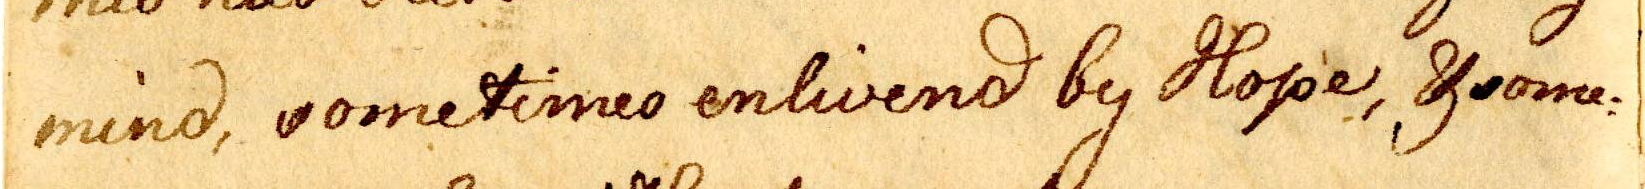mind, sometimes enlivend by Hope, & some-
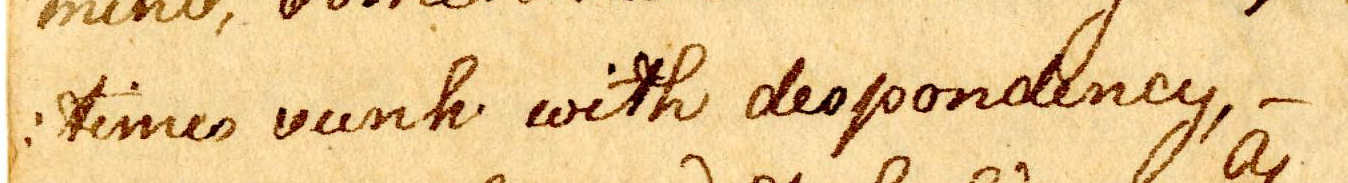-times sunk with despondency,-
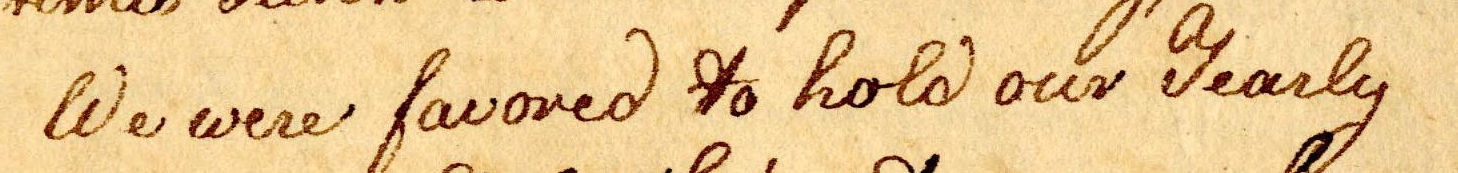We were favored to hold our Yearly
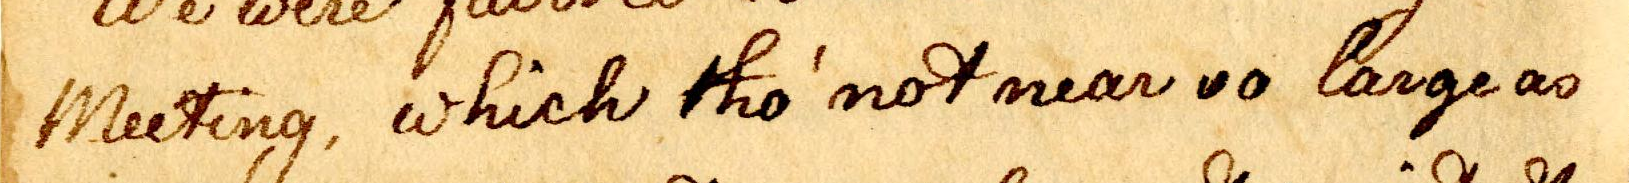Meeting, which tho' not near so large as
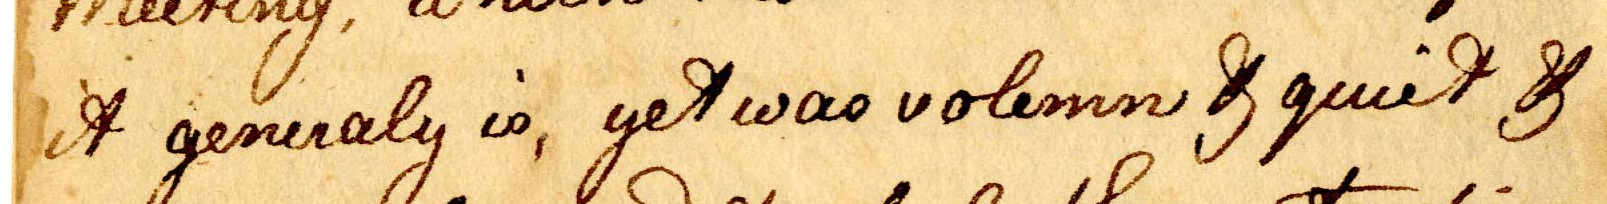it generaly is, yet was solemn & quiet &
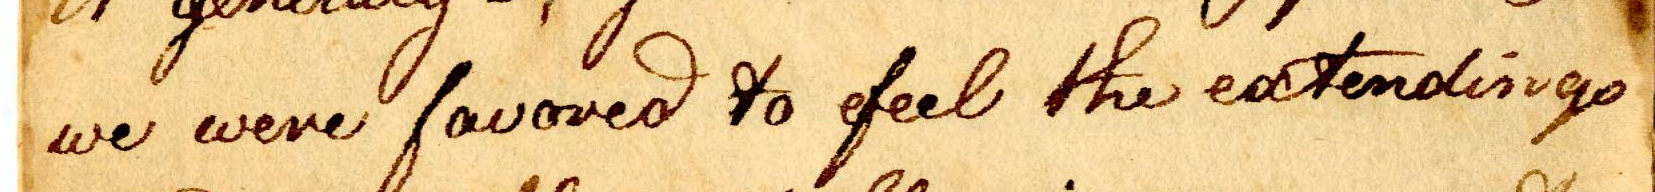we were favored to feel the extendings
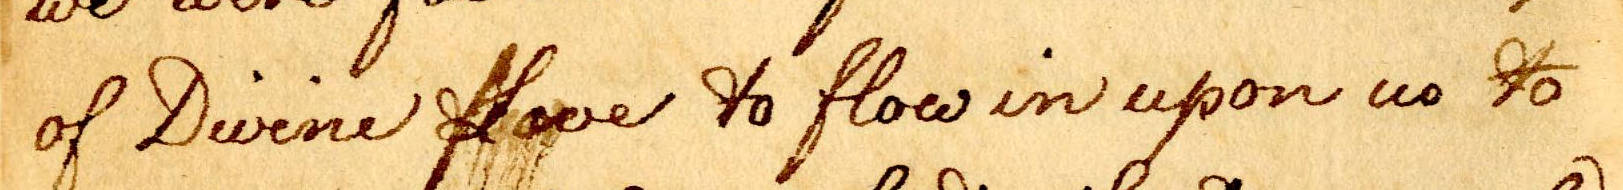of Divine Love to flow in upon us to
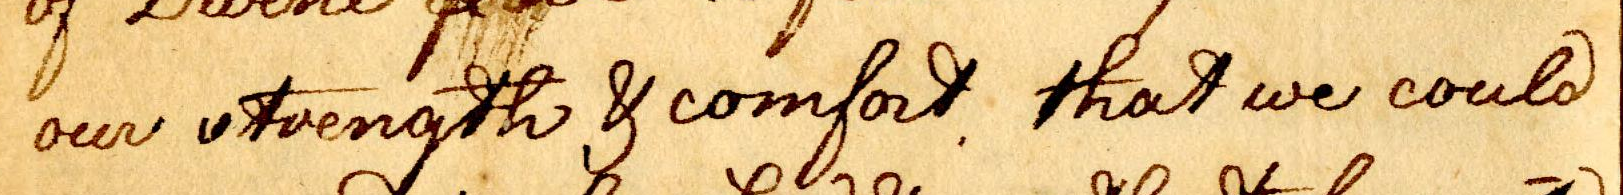our strength & comfort, that we could
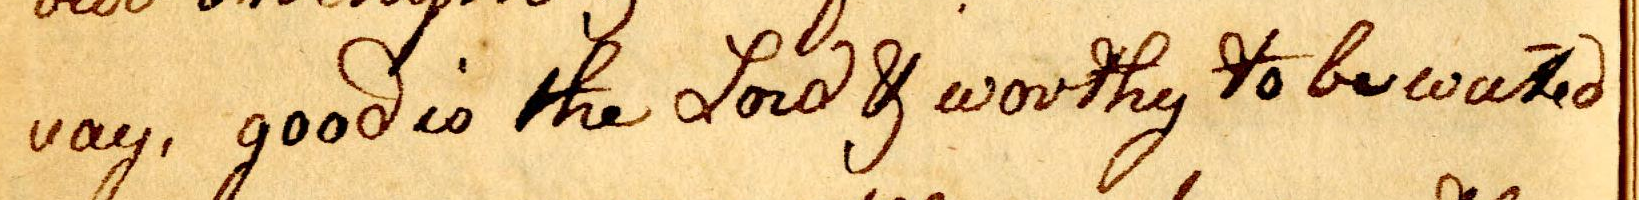say, good is the Lord & worthy to be waited
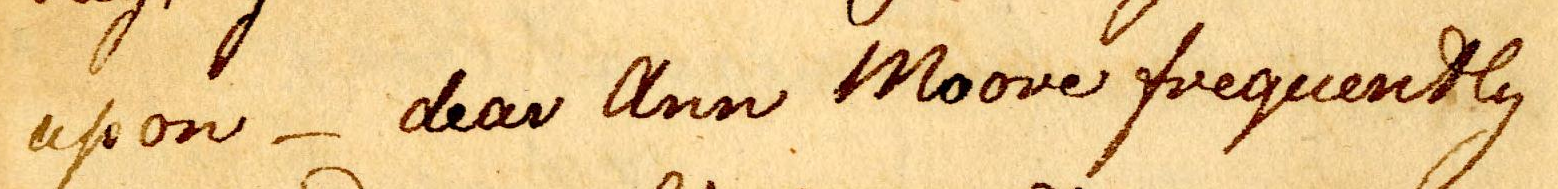upon- dear Ann Moore frequently
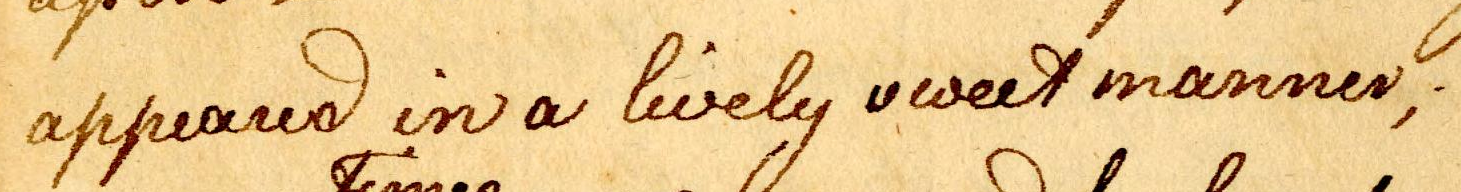appeared in a lively sweet manner,
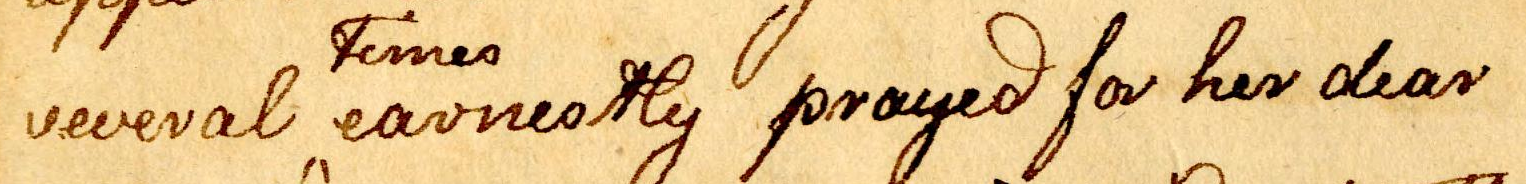several earnestly prayed for her dear
